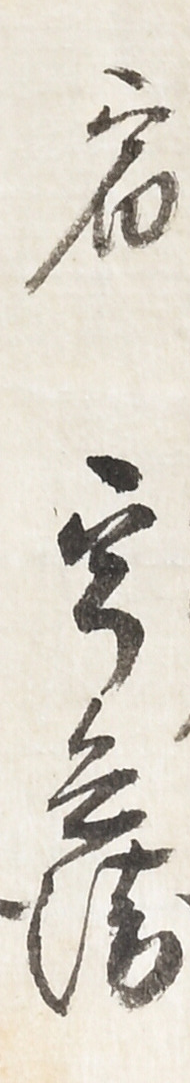宿宇兵衛
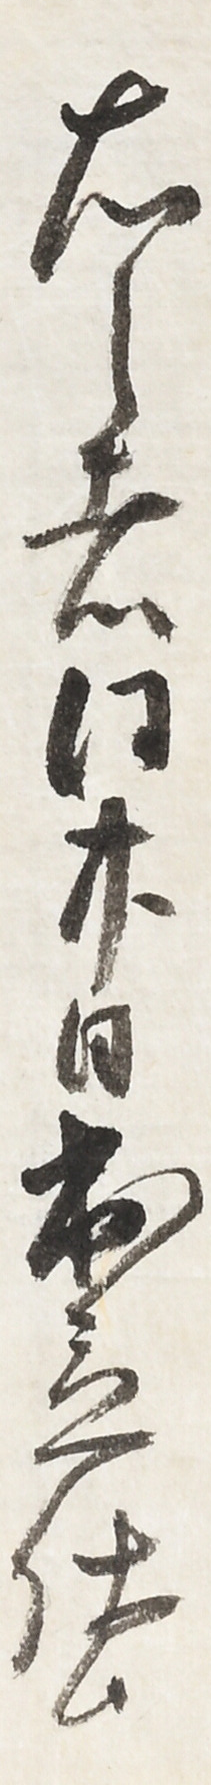右之者同廿日出立仕候
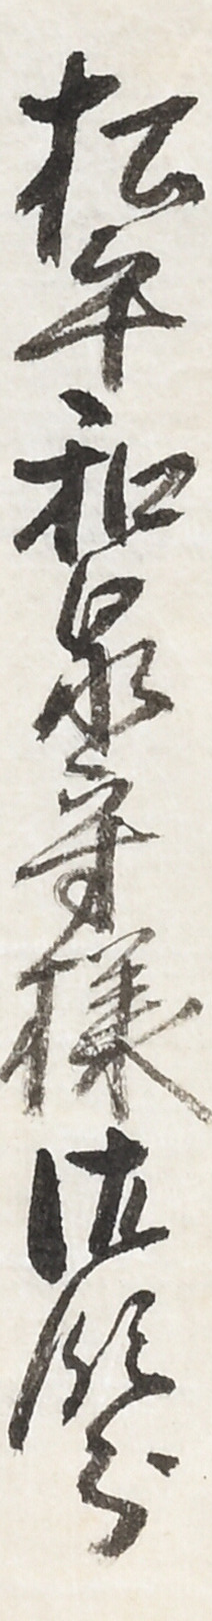松平和泉守様御領分
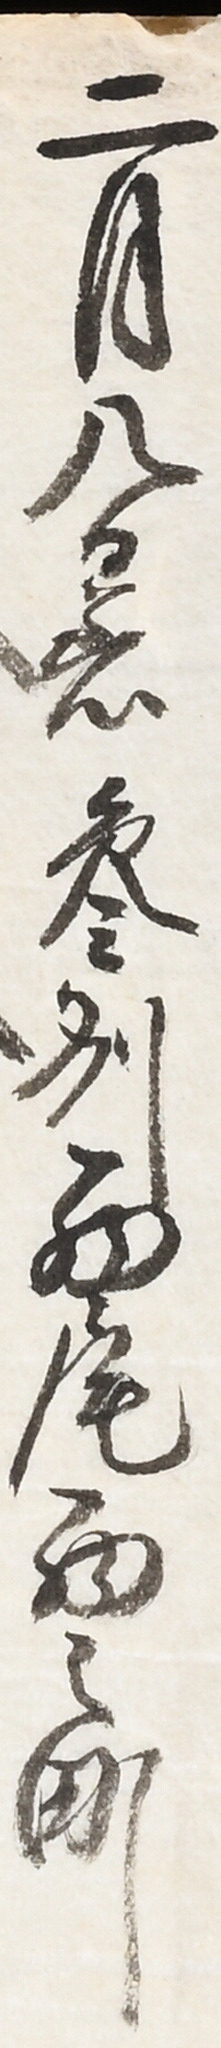二月八日着三州西尾西之町
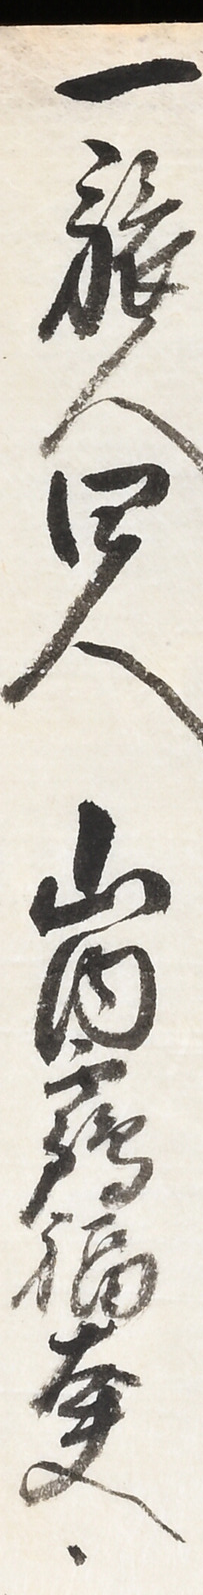一旅人四人山内靏福大夫
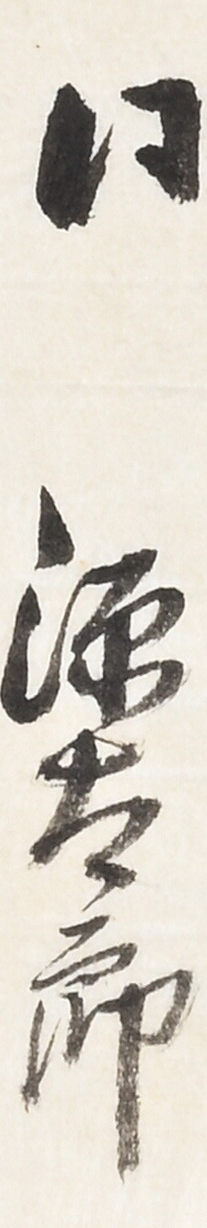同源太郎
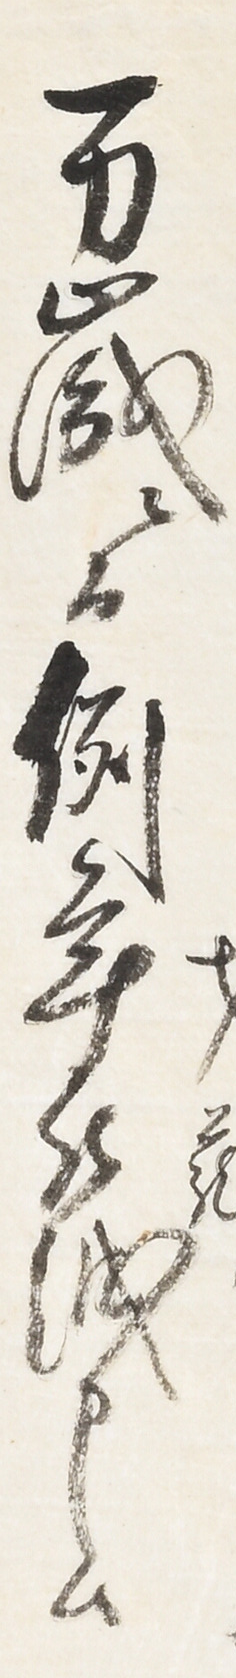万歳ニ而例年罷越申候
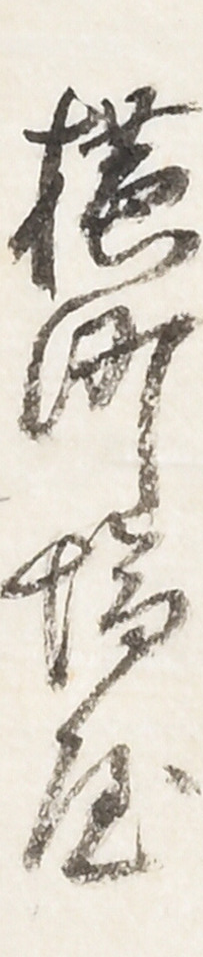横町塩屋
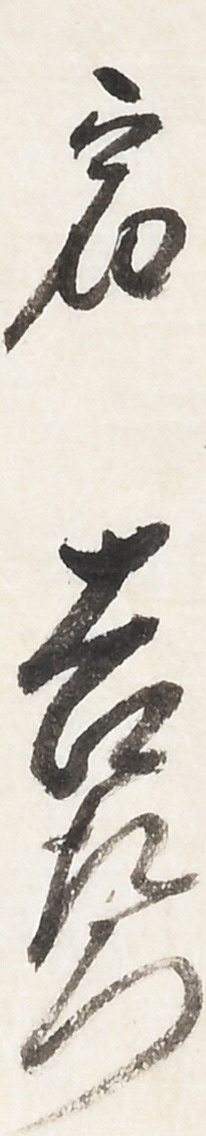宿吉左衛門
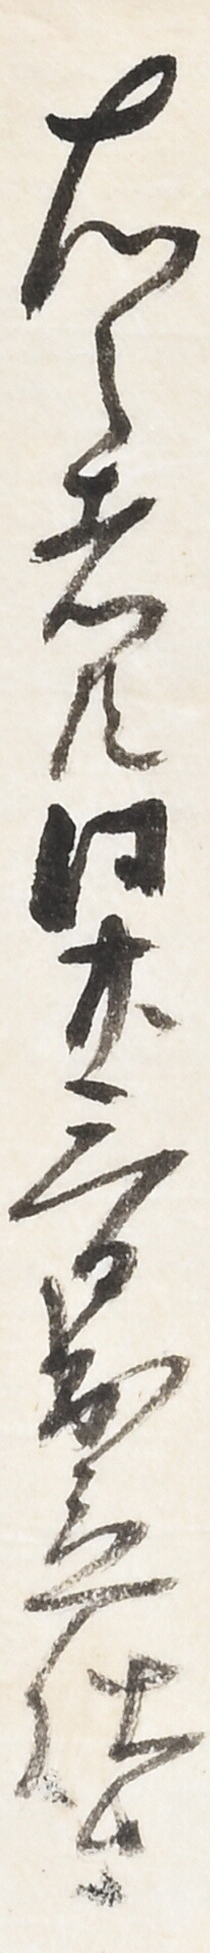右之者共廿三日出立仕候
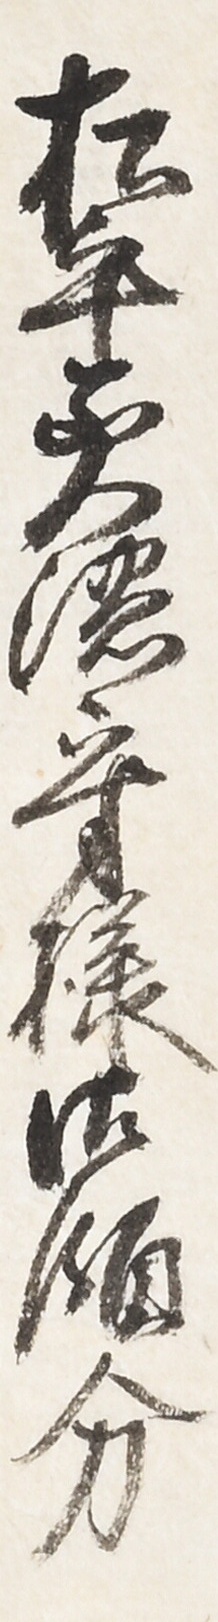松平美濃守様御領分
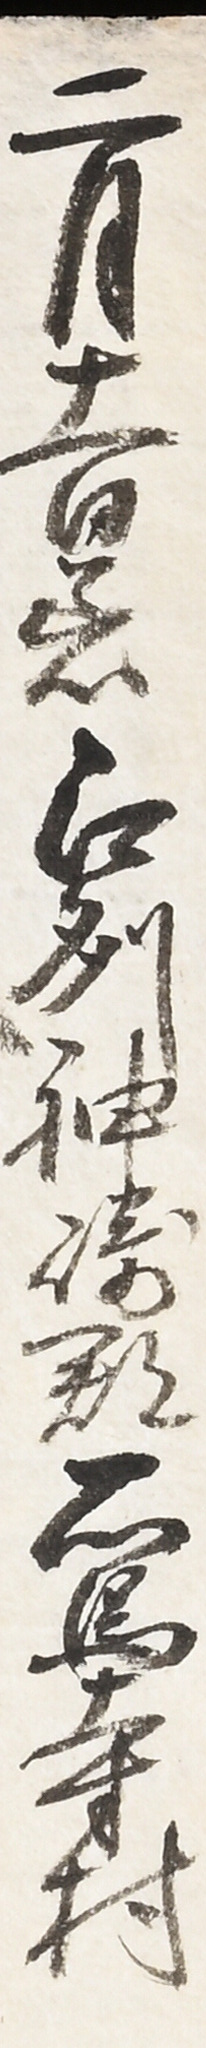二月十一日着江州神崎郡石馬寺村
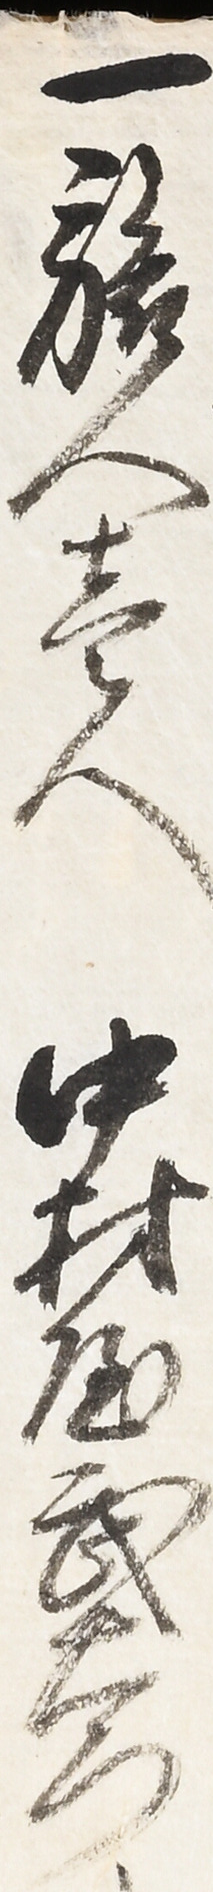一旅人壱人中村屋武右衛門・
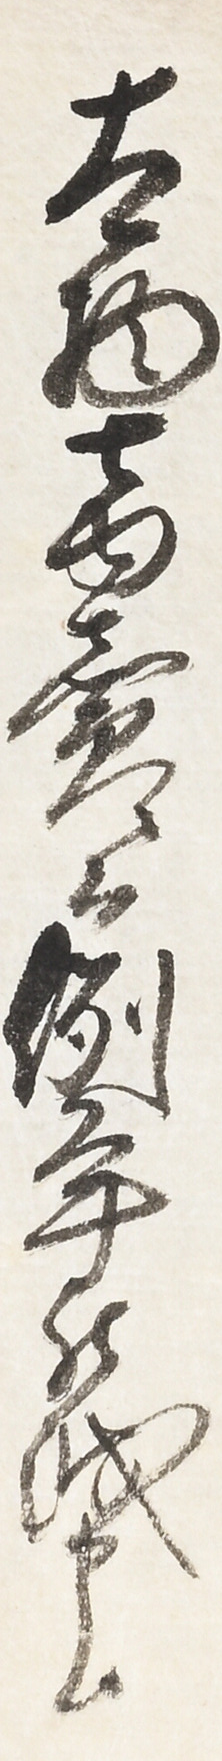太物商売ニ而例年罷越申候
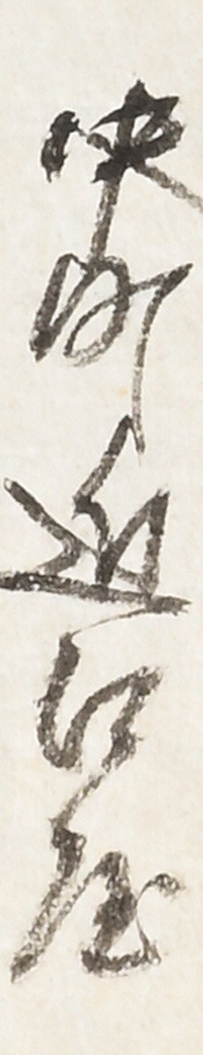中町近江屋
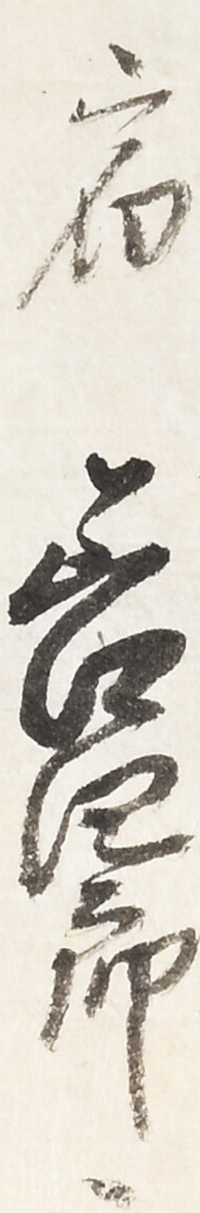宿善四郎
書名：旅人泊控帳
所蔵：伊那市立高遠町図書館・合同会社AMANE
